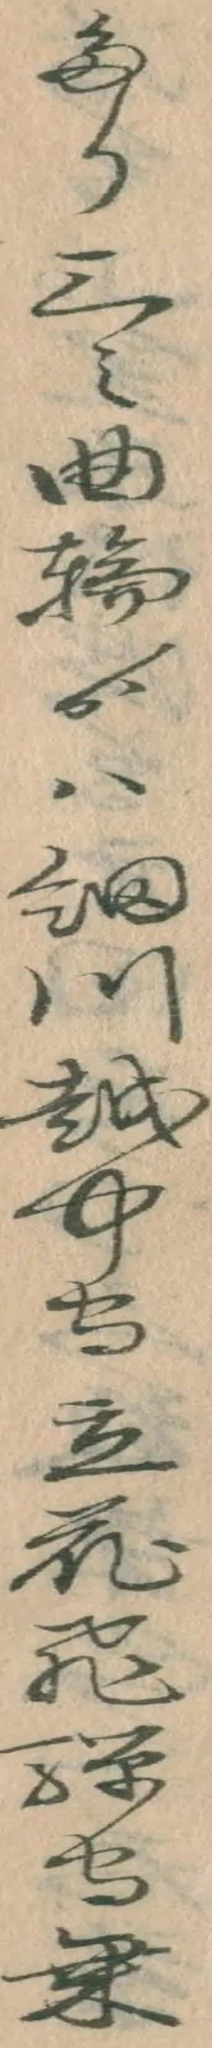多り三之曲輪ゟは細川越中守立花飛騨守乗
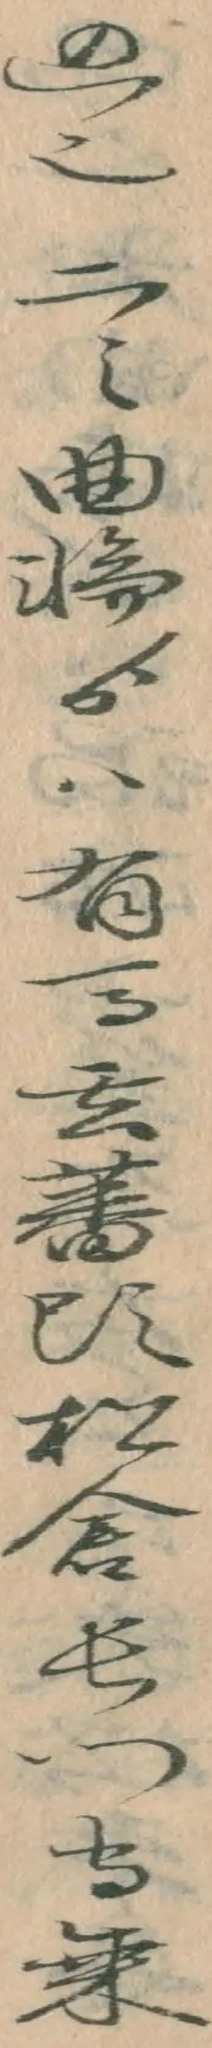込也二之曲輪ゟは有馬玄蕃頭松倉長門介乗

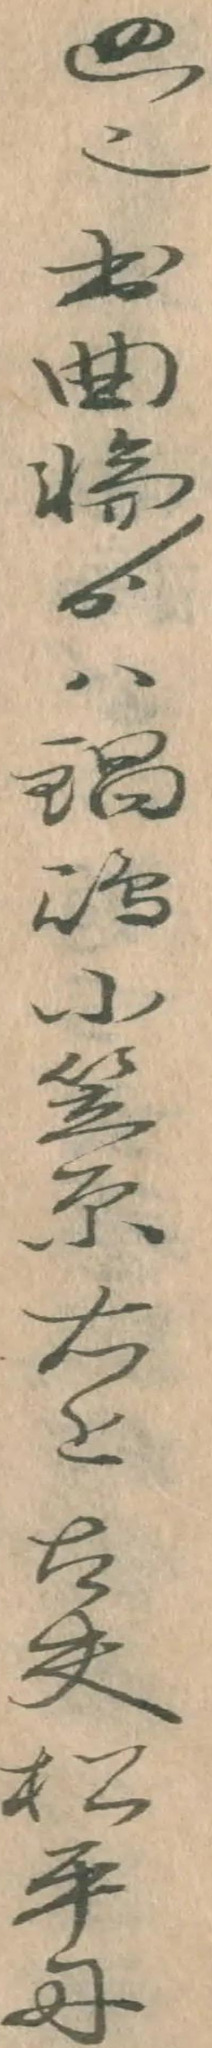込也出曲輪ゟは鍋島小笠原右近太夫松平丹
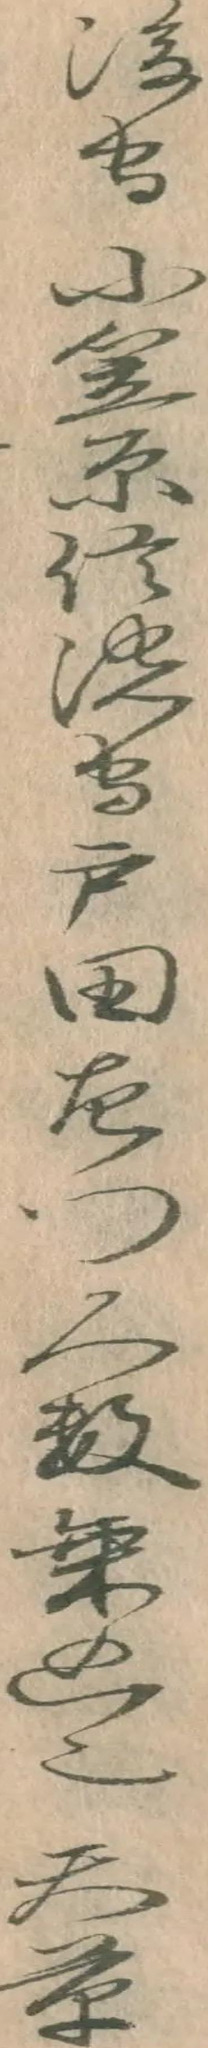後守小笠原信濃守戸田左門人数乗込也天草
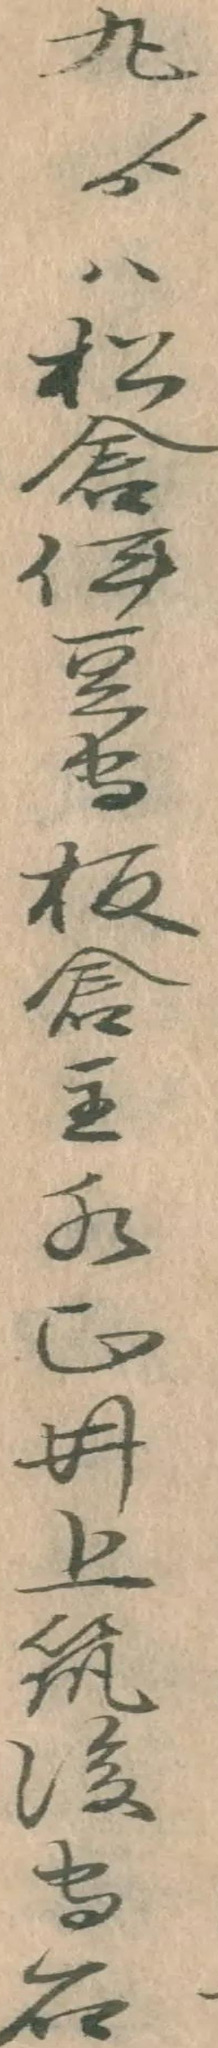丸ゟは松倉伊豆守板倉主水正井上筑後守石
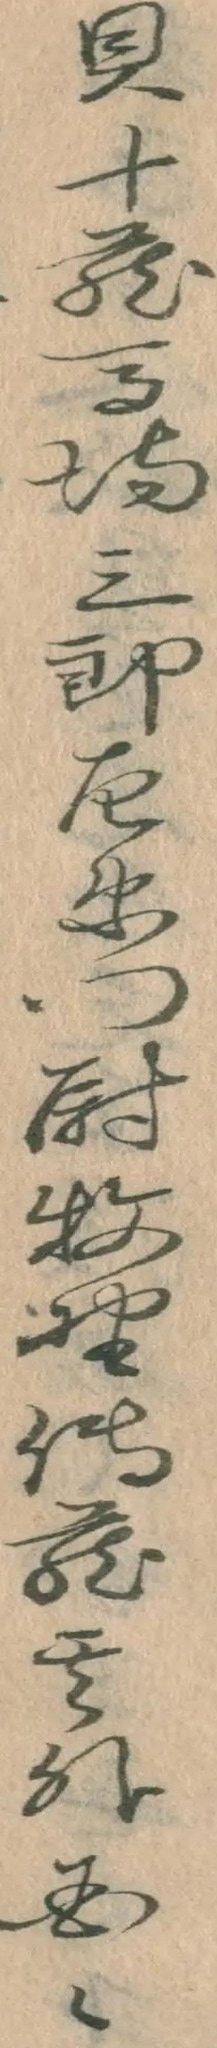貝十蔵馬場三郎左衛門尉牧野伝蔵其外国々
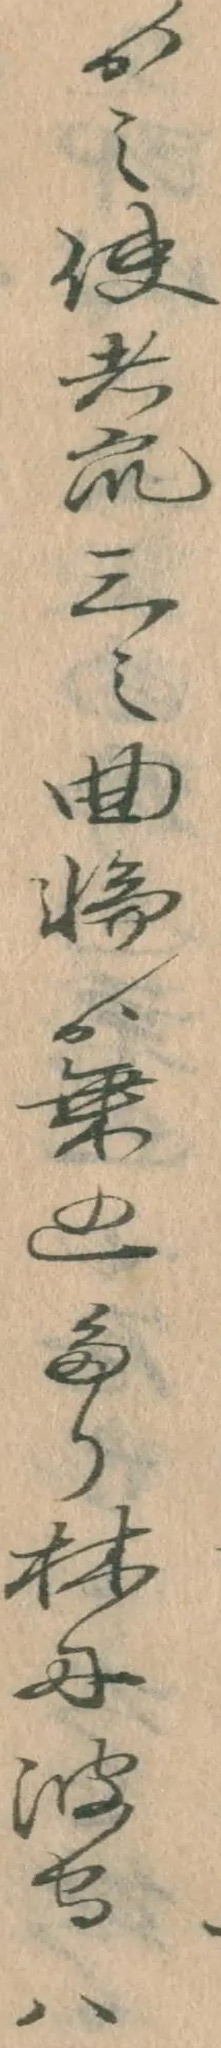ゟ之使者就三之曲輪ゟ乗込多り林丹波守は
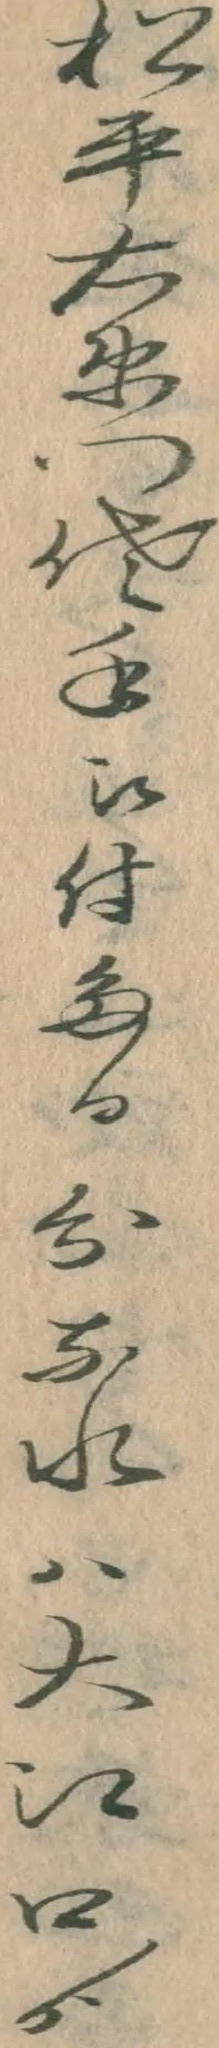松平右衛門佐手江付多る分なれは大江口ゟ
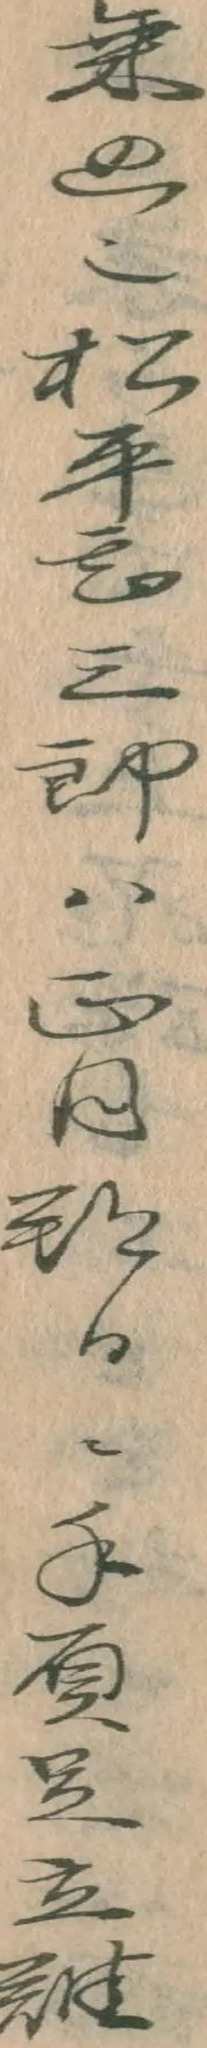乗込也松平甚三郎は正月朔日に手負足立難
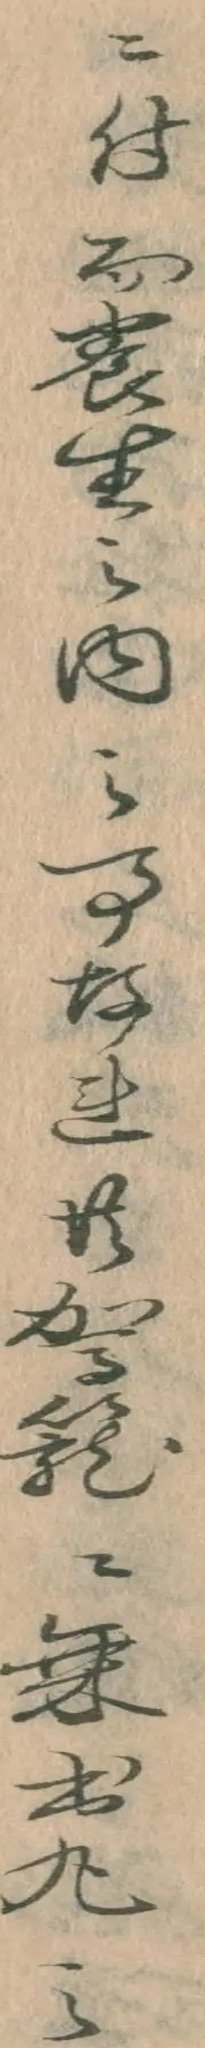に付而養生之内之事な連共駕籠に乗出丸之
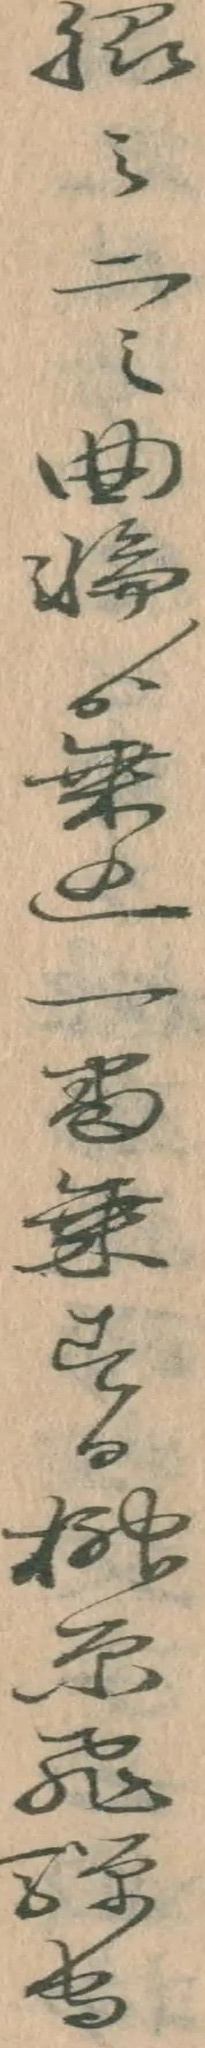脇之二之曲輪ゟ乗込一番乗春る榊原飛騨守
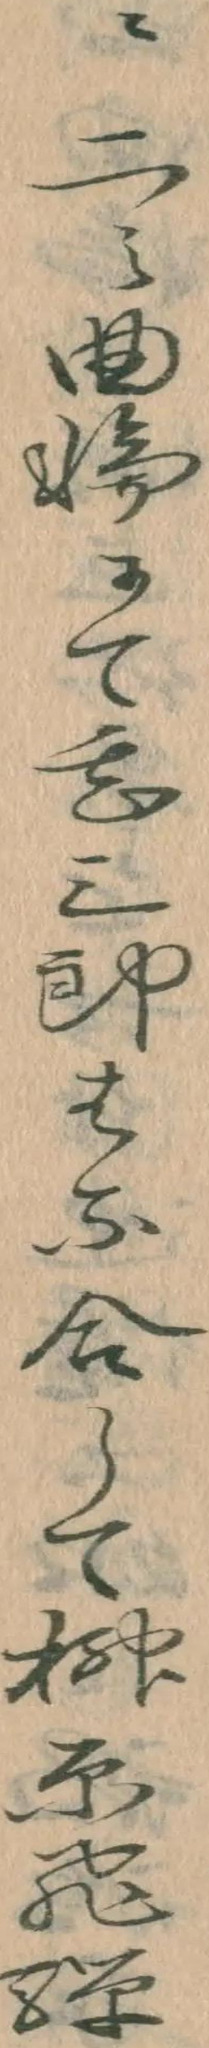に二之曲輪尓て甚三郎者な合して榊原飛騨
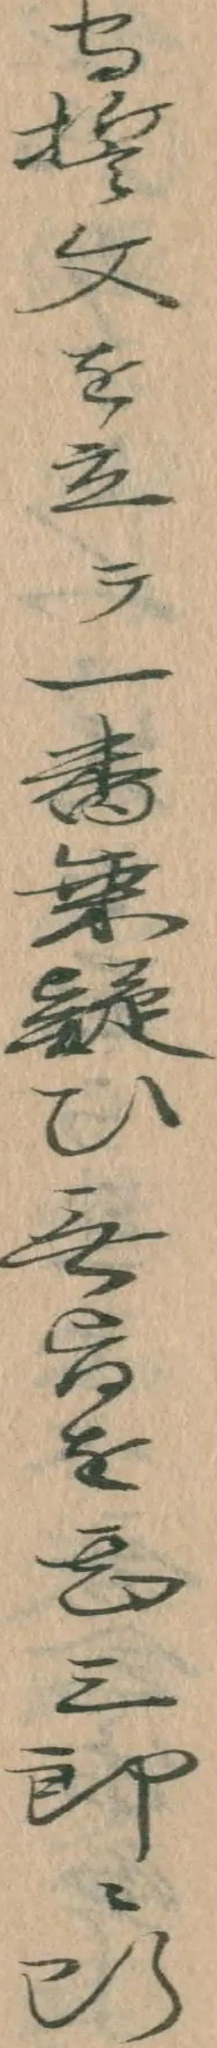守誓文を立て一番乗疑ひ無旨を甚三郎に断
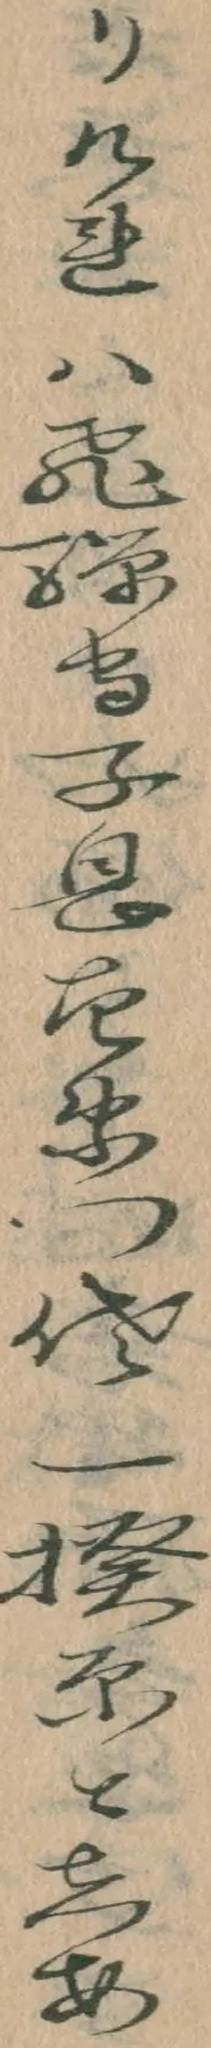りけ連は飛騨守子息左衛門佐一揆原と志あ
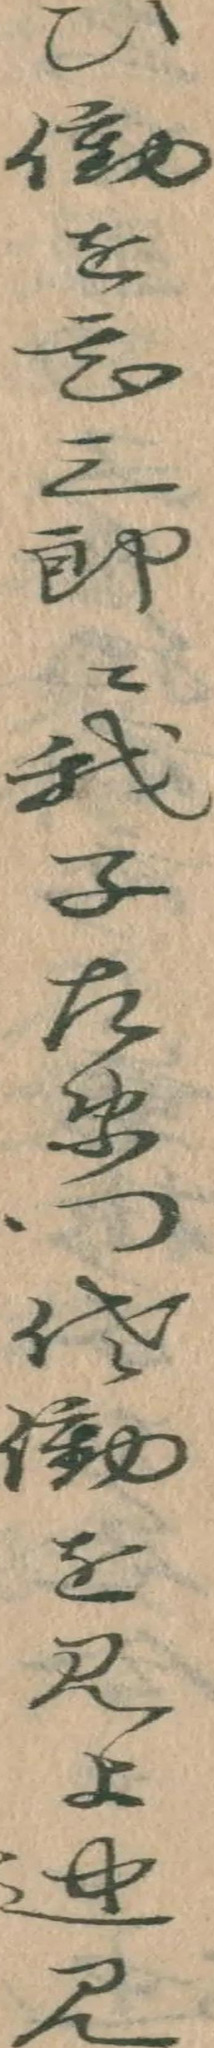ひ働を甚三郎に我子左衛門佐働を見よ迚見
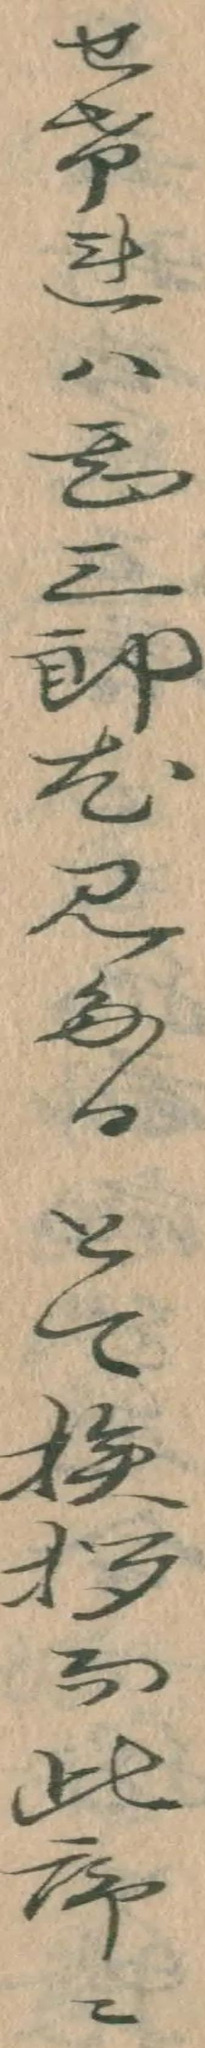せ希連は甚三郎尤見多るとて挨拶而此席に
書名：切支丹御退治記 49巻. [8]
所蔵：国立国会図書館 National Diet Library, JAPAN
